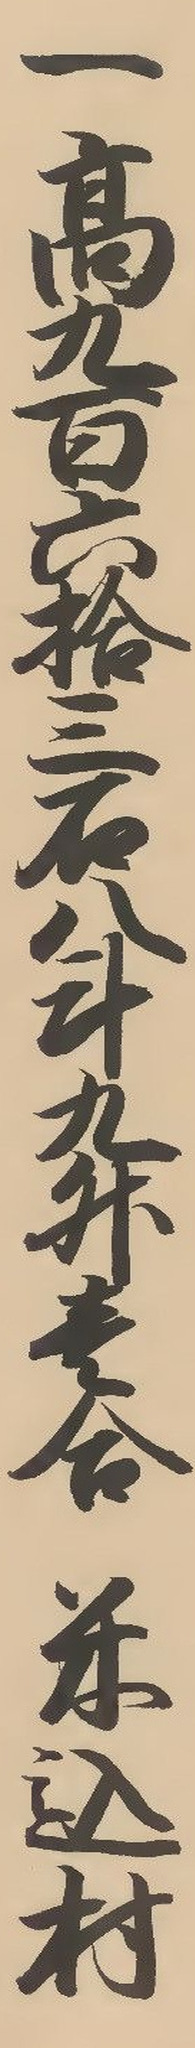一高九百六拾三石八斗九升壱合米込村
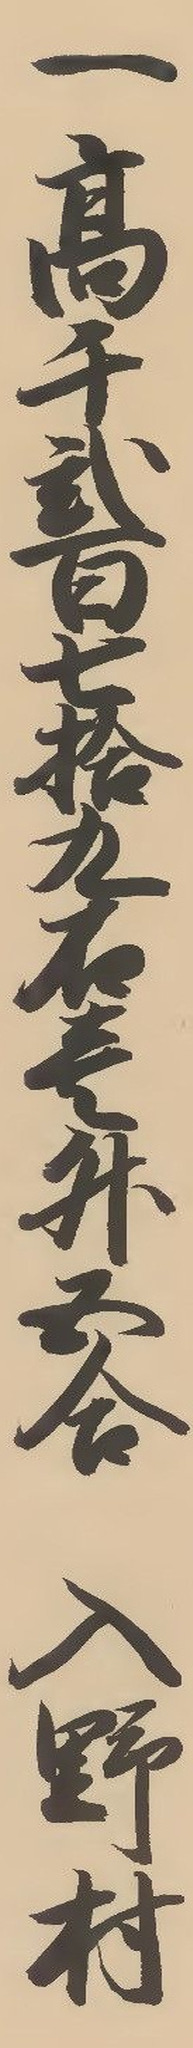一高千弐百七拾九石壱升五合入野村
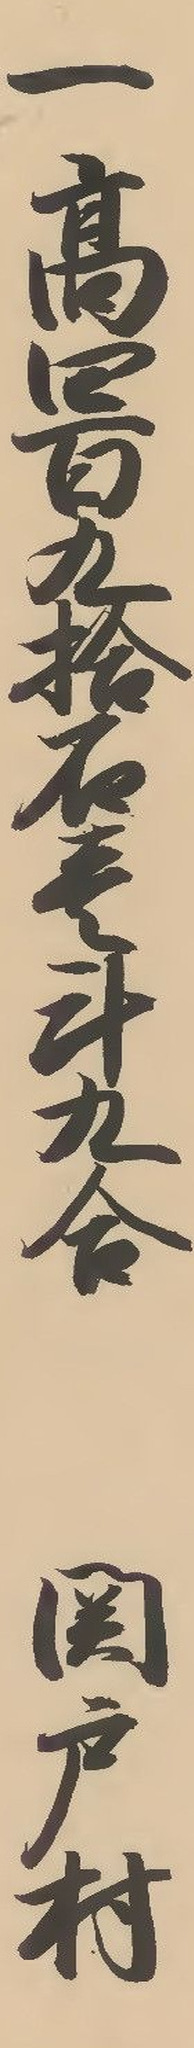一高四百九拾石壱斗九合関戸村

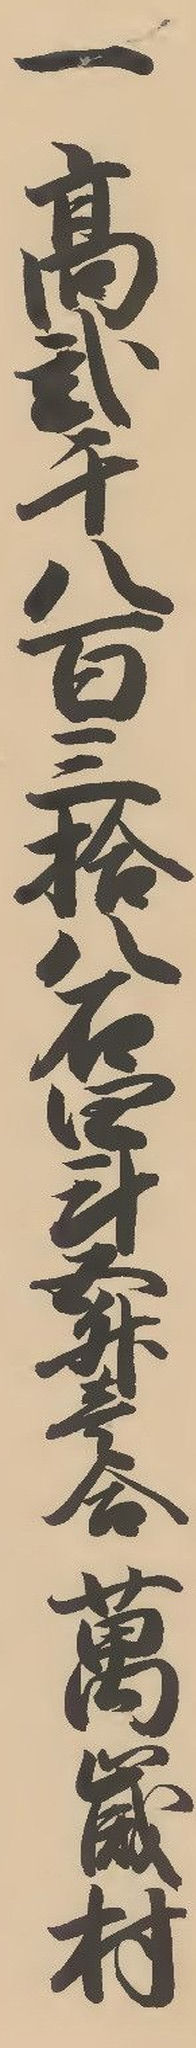一高弐千八百三拾八石四斗五升壱合万歳村
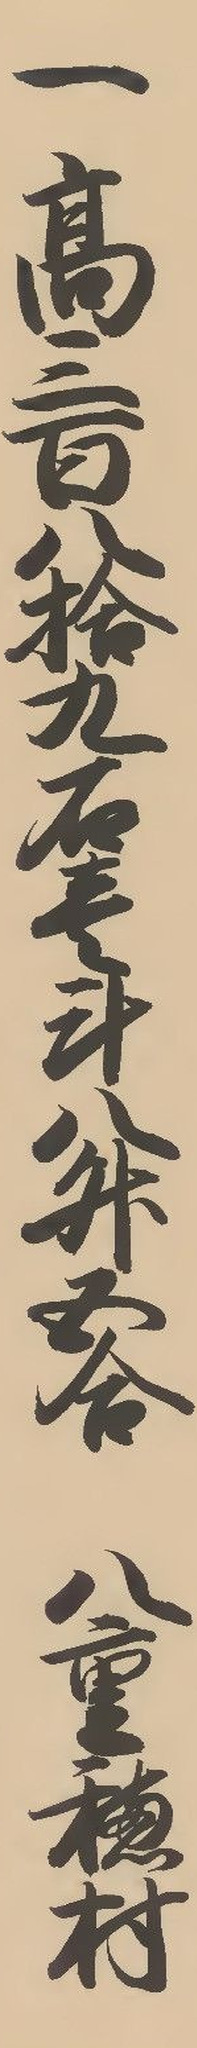一高三百八拾九石壱斗八升五合八重穂村
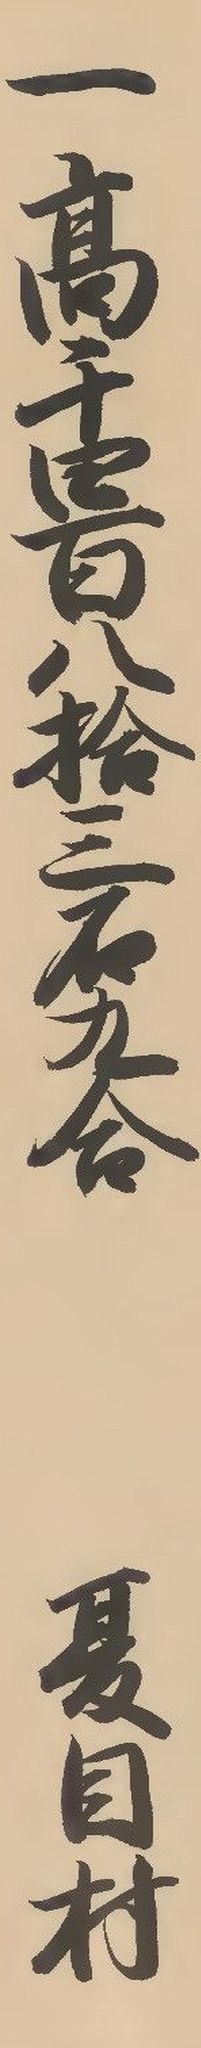一高千四百八拾三石九合夏目村
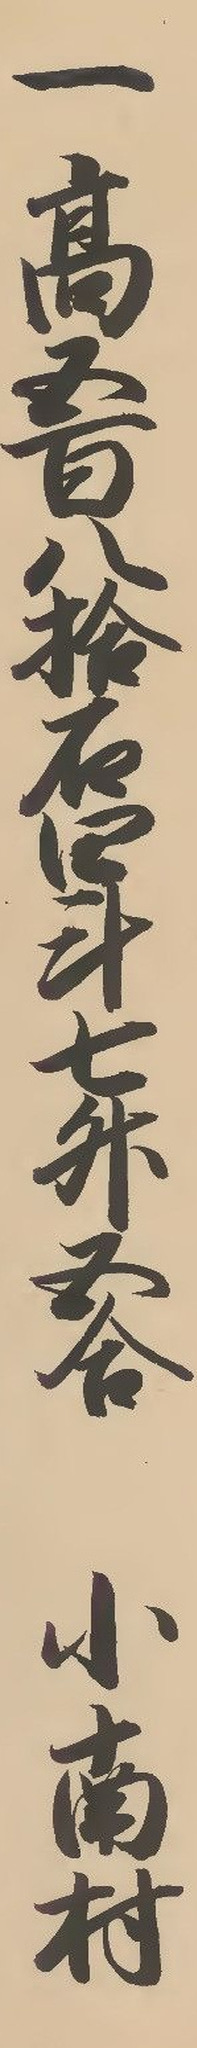一高五百八拾石四斗七升五合小南村
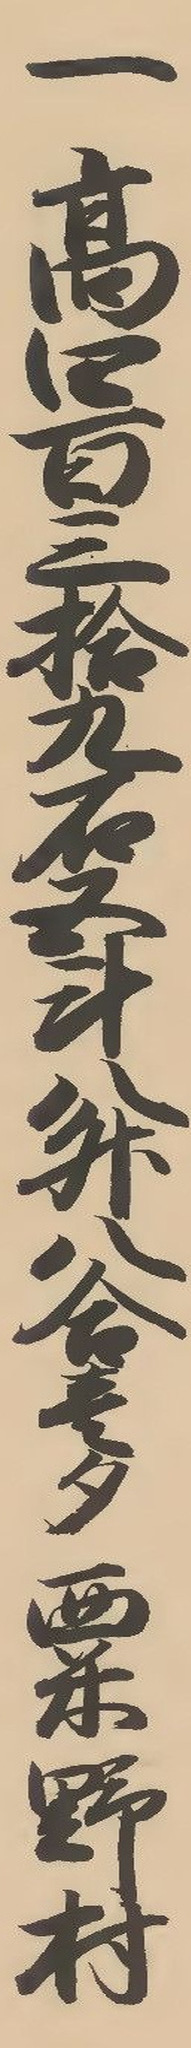一高四百三拾九石五斗八升八合壱勺粟野村
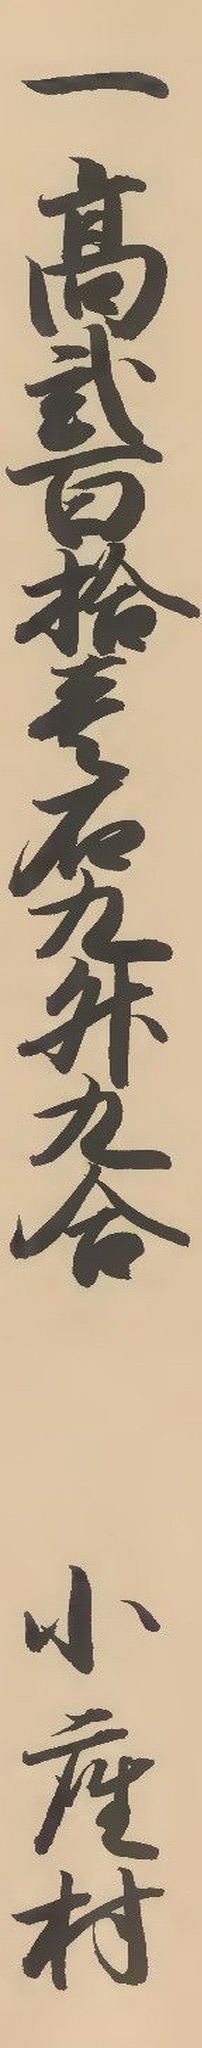一高弐百拾壱石九升九合小座村
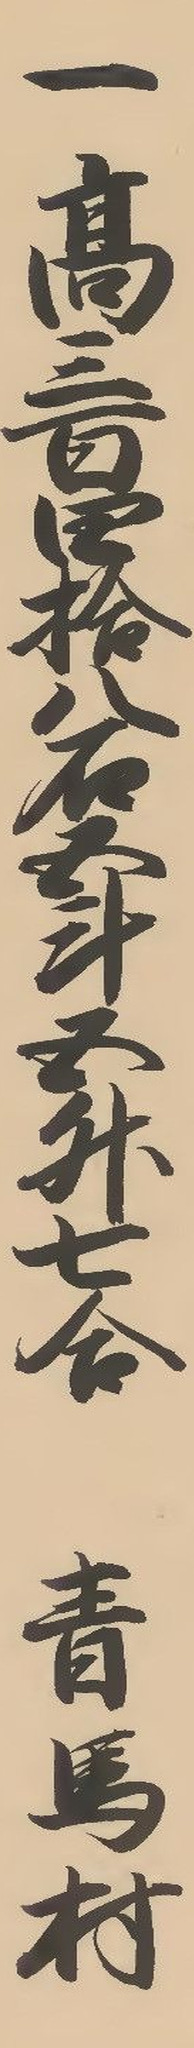一高三百四拾八石五斗五升七合青馬村
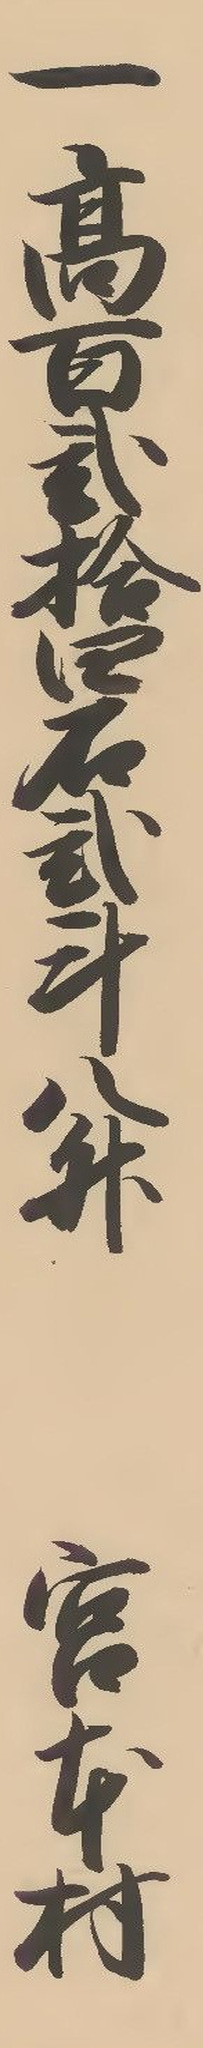一高百弐拾四石弐斗八升宮本村

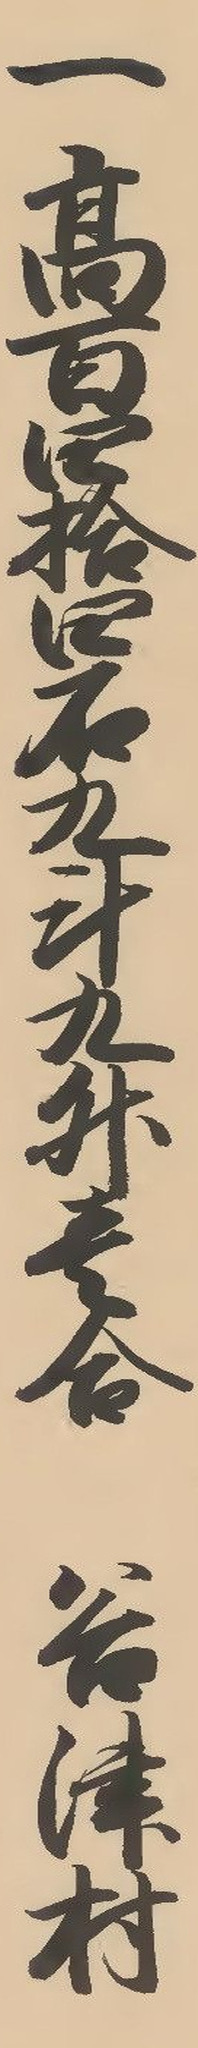一高百四拾四石九斗九升壱合谷津村
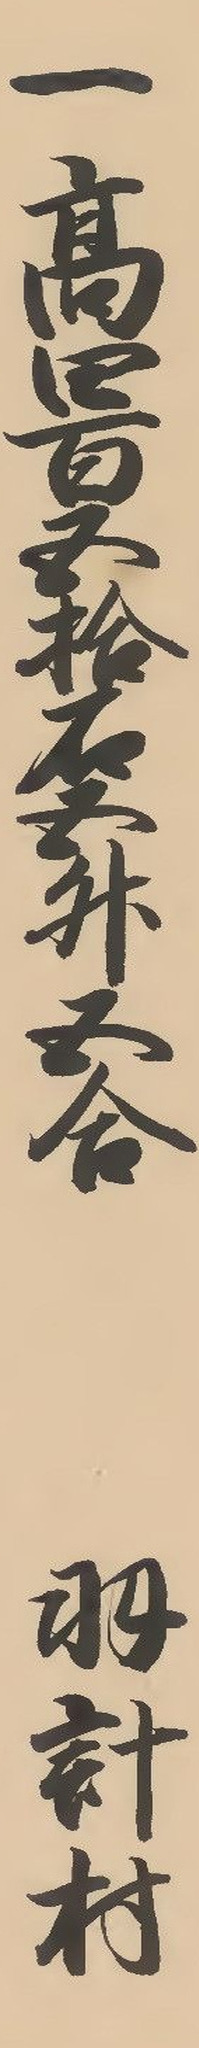一高四百五拾石五升五合羽計村
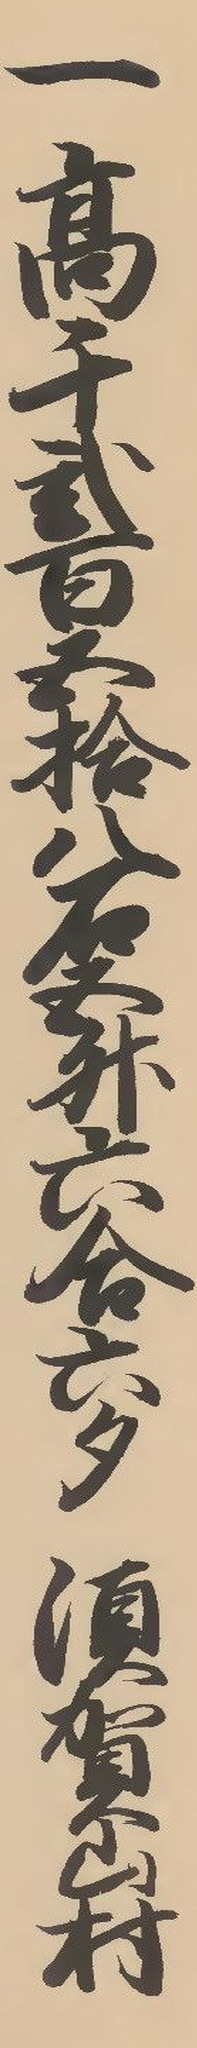一高千弐百五拾八石五升六合六勺須賀山村
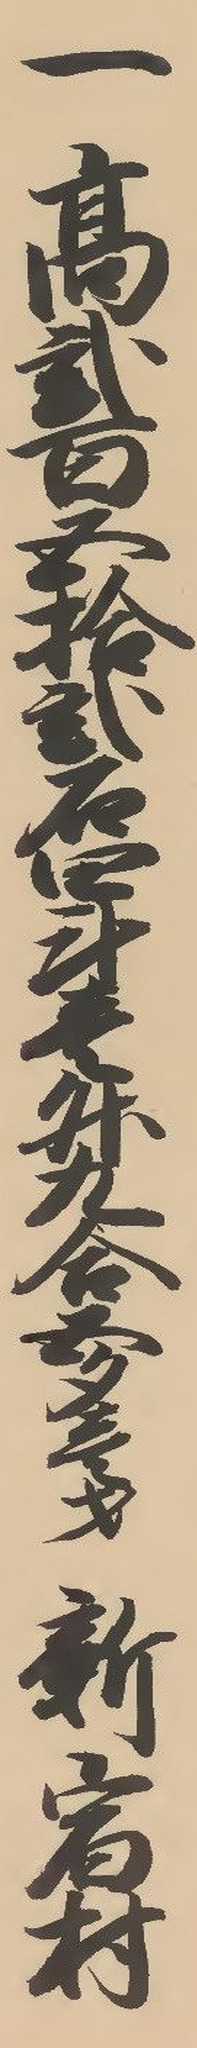一高弐百五拾弐石四斗壱升九合五勺壱才新宿村
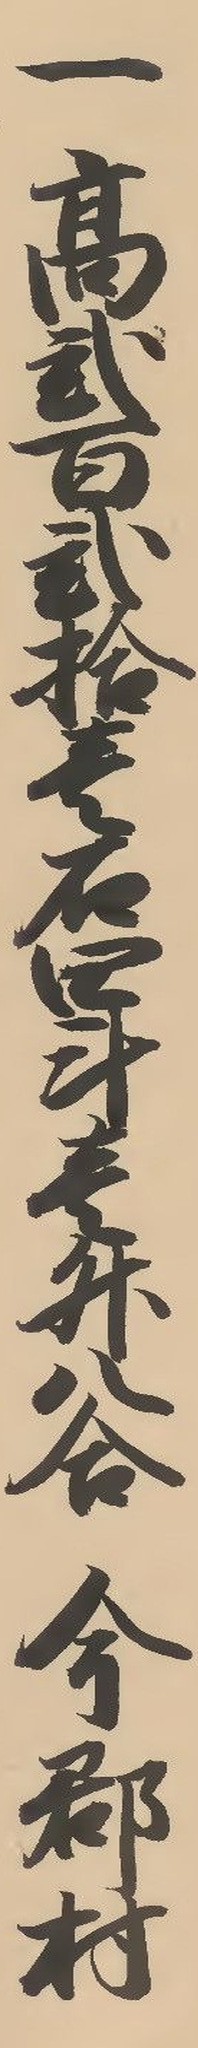一高弐百弐拾壱石四斗壱升八合今郡村
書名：下総国郷帳
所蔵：国立公文書館 National Archives of Japan
